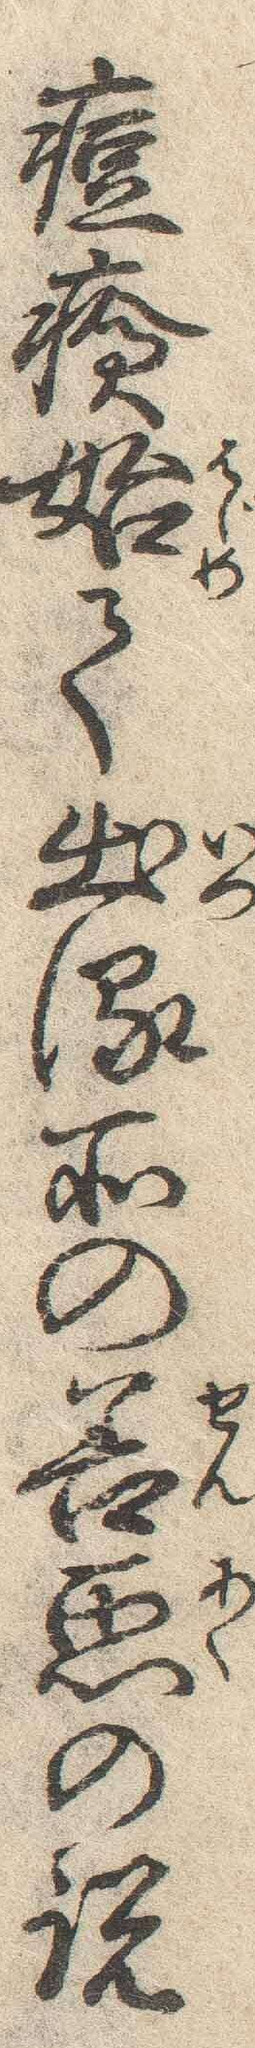㊈痘瘡始て出る所の善悪の説
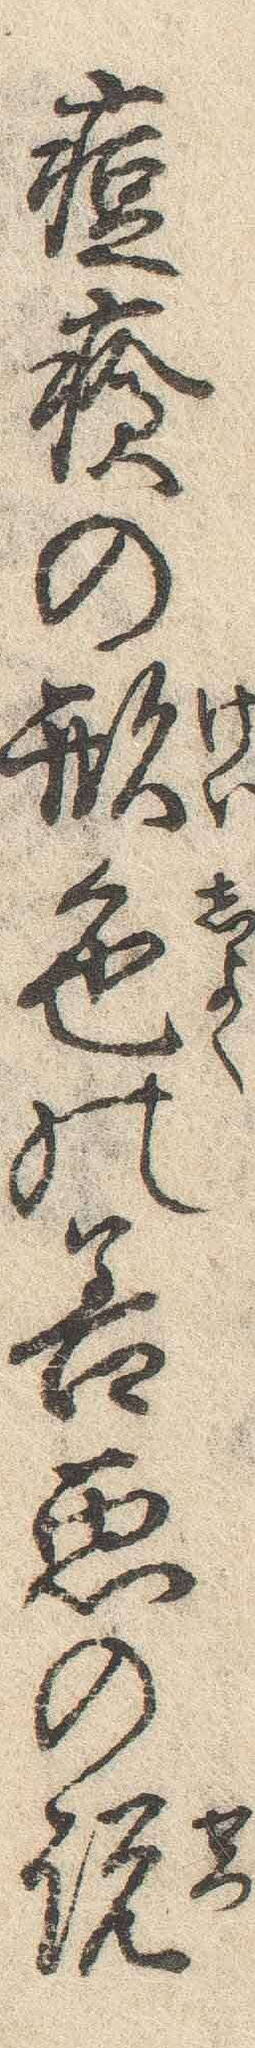㊉痘瘡の形色の善悪の説
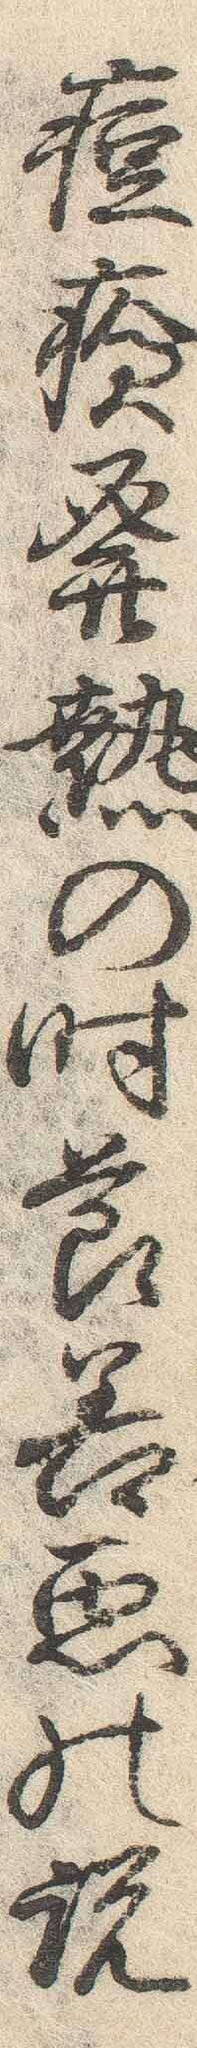(十二)痘瘡発熱の時節善悪の説
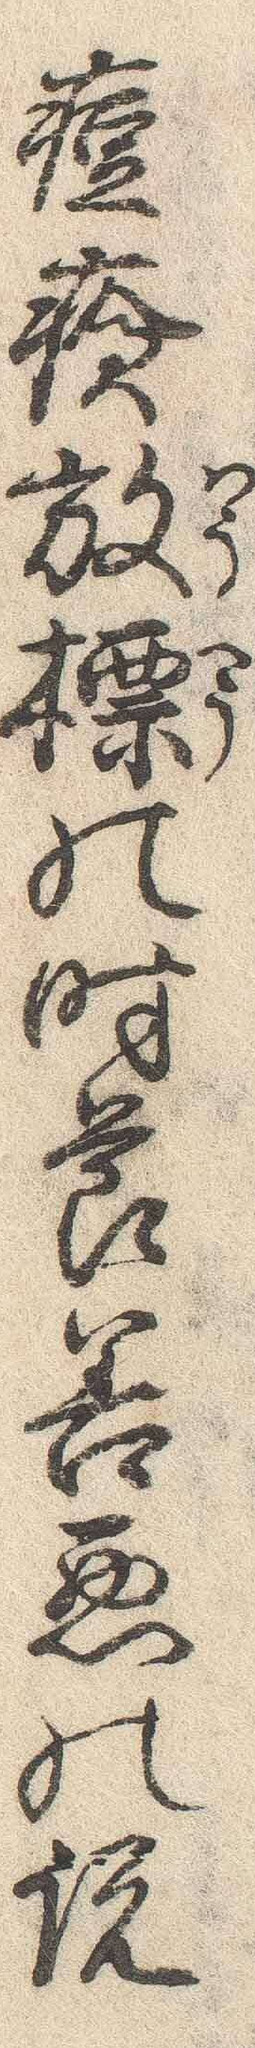(十二)痘瘡発熱の時節善悪の説
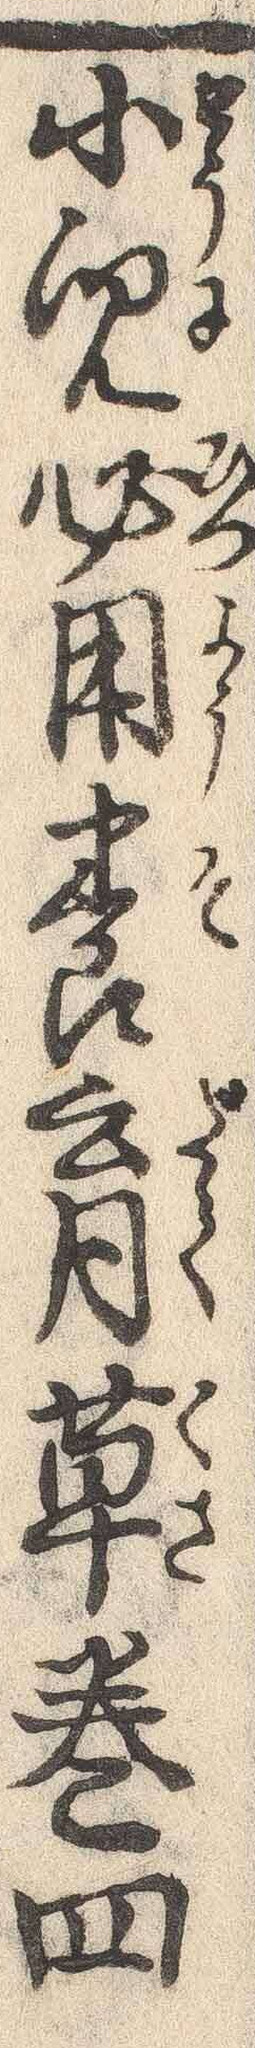小児必用養育草巻四
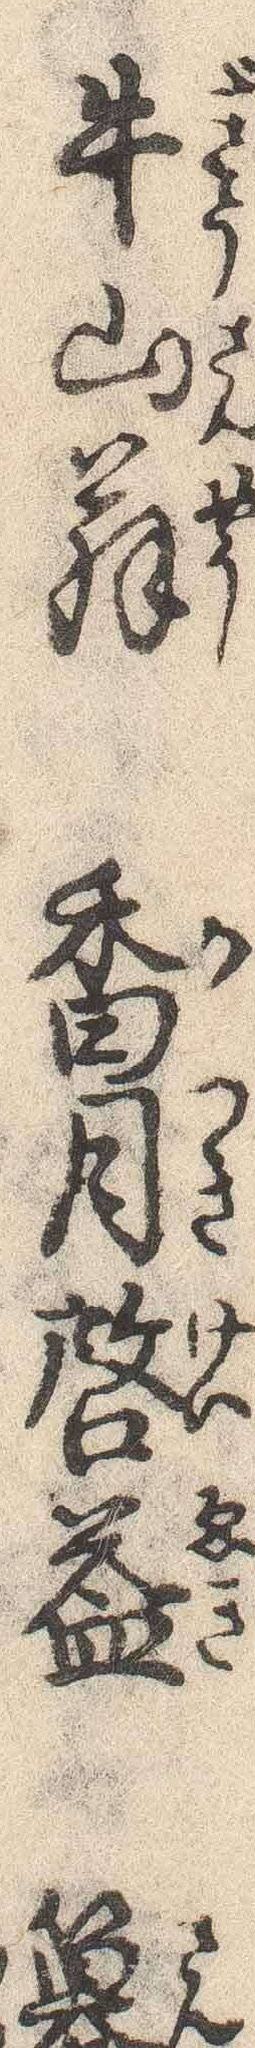牛山翁香月啓益
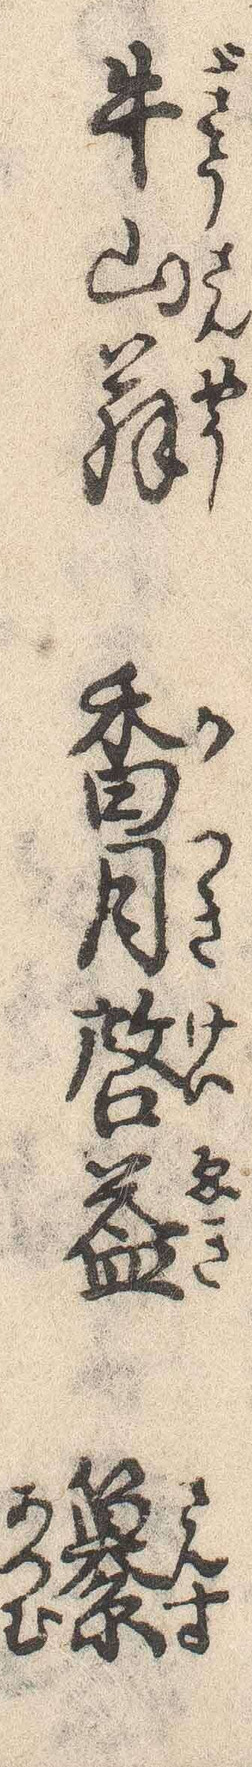牛山翁香月啓益
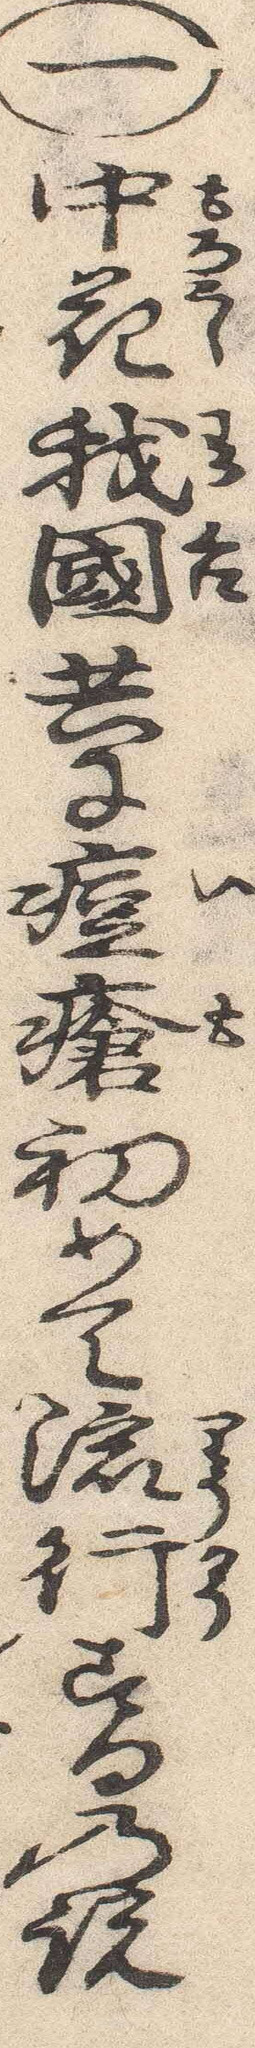㊀中花我国共に痘瘡初めて流行するの説
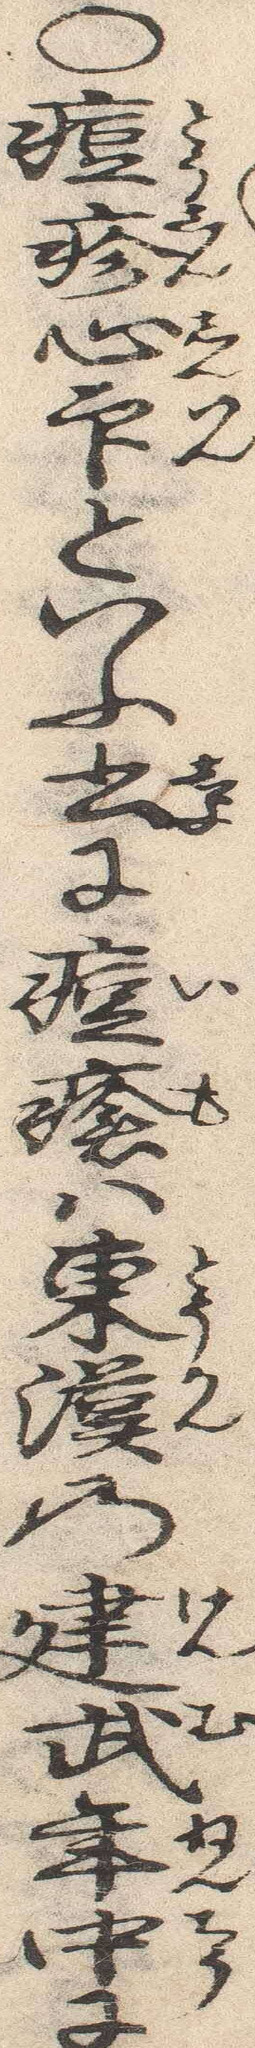○痘診心印といふ書に痘瘡は東漢の建武年中に
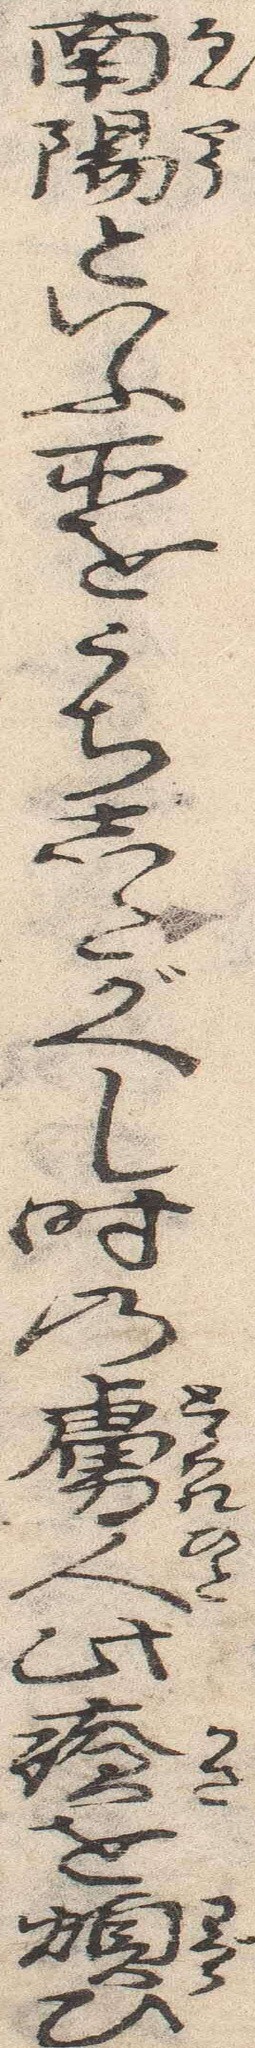南陽といふ所をうちしたがへし時の虜人此瘡を煩ひ
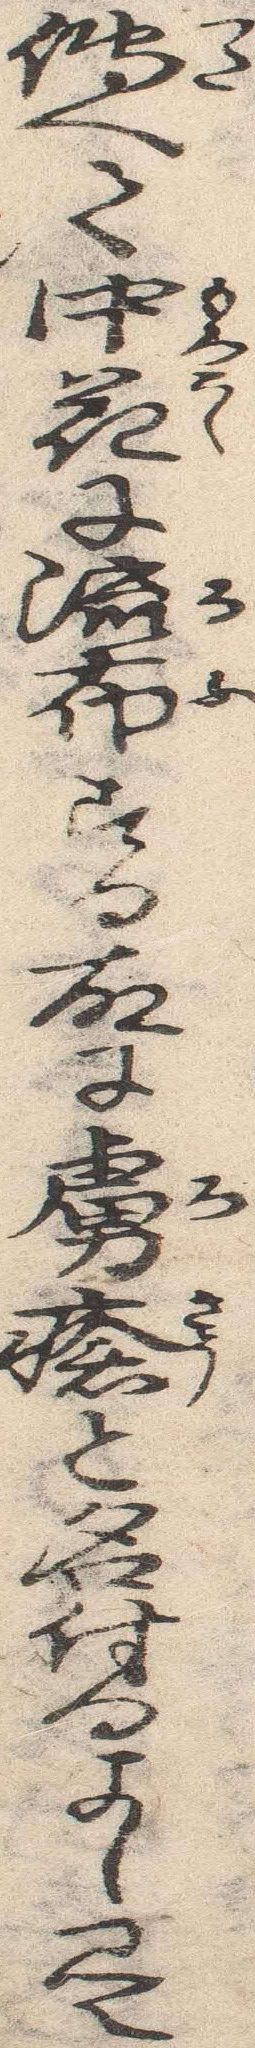伝へて中花に流布する故に虜瘡と名付るよし見え
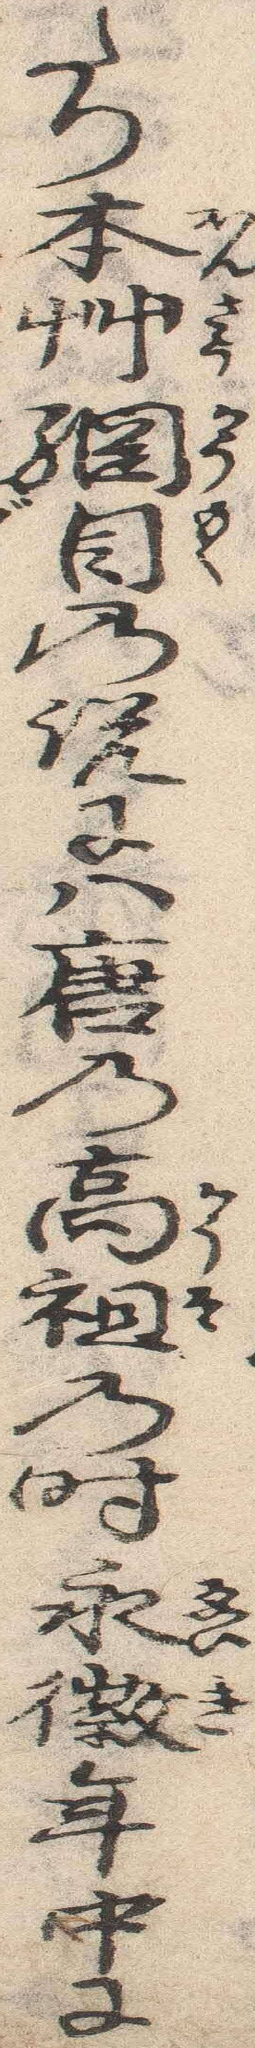たり本草綱目の説には唐の高祖の時永徽年中に
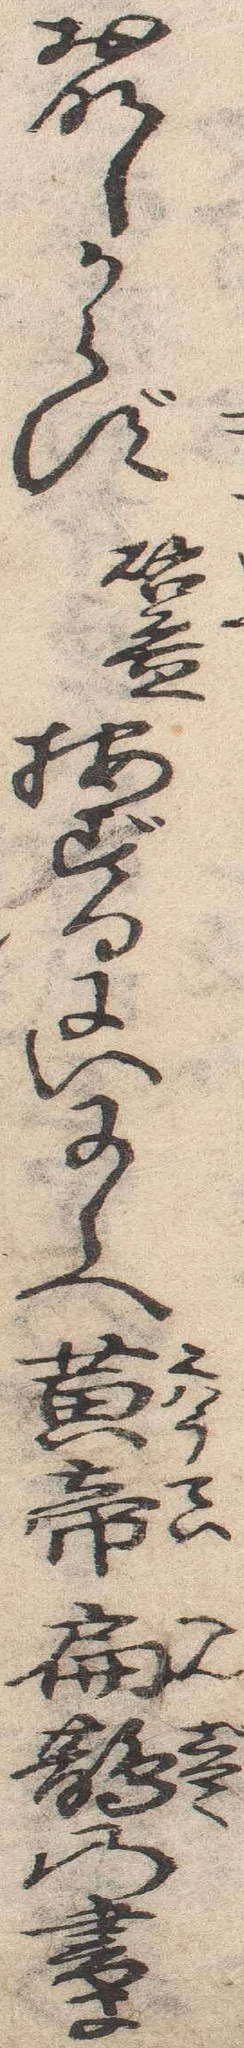おなしからず啓益按ずるにいにしへ黄帝扁鵲の書に
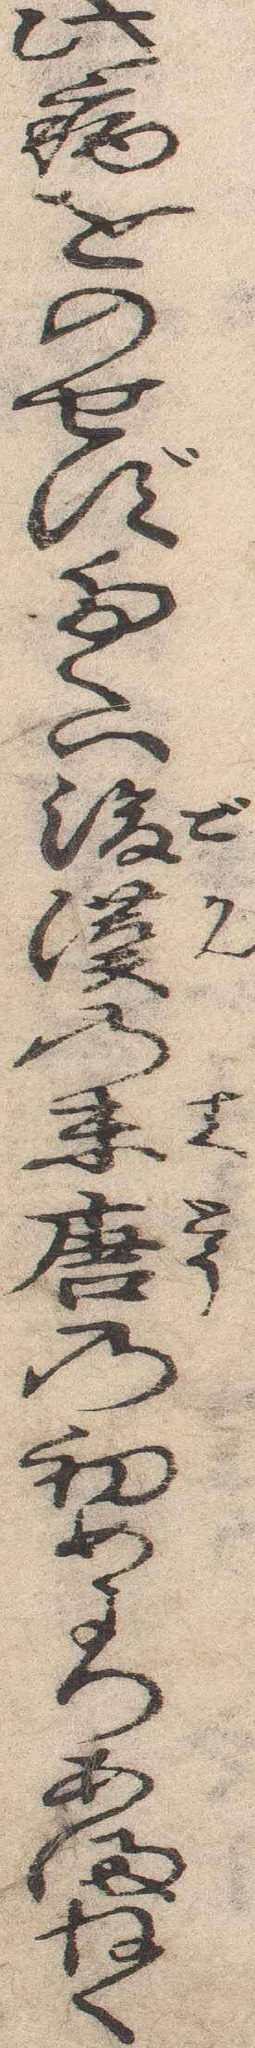此病をのせず多くは後漢の末唐の初めよりあまねく

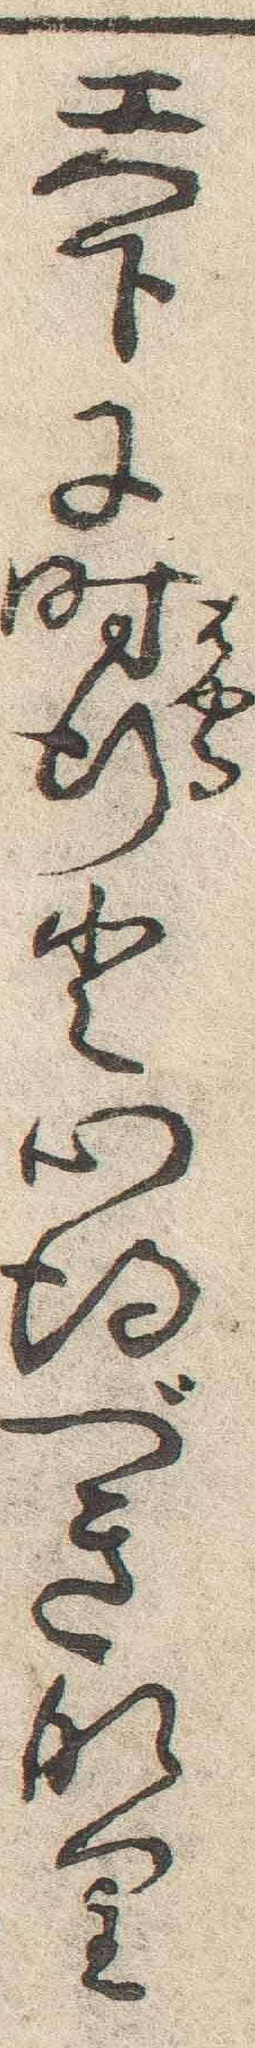天下に時行と心得べきなり
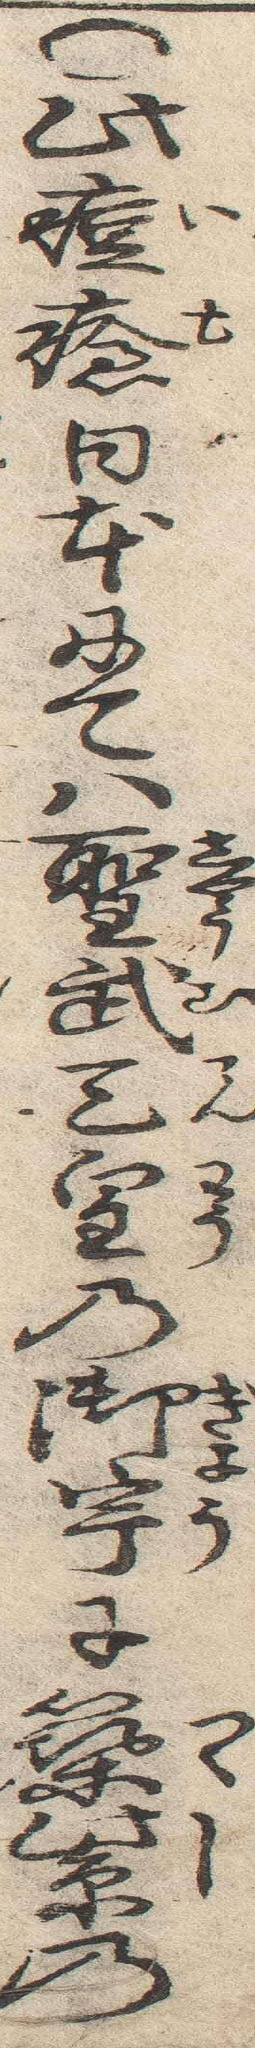○此痘瘡日本にては聖武天皇の御宇に築紫の
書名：小児必用養育草
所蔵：東京学芸大学附属図書館 国文学研究資料館
